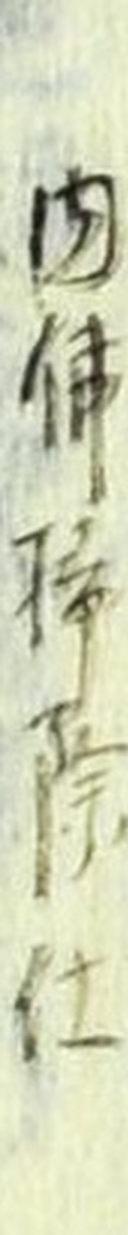内仏掃除仕
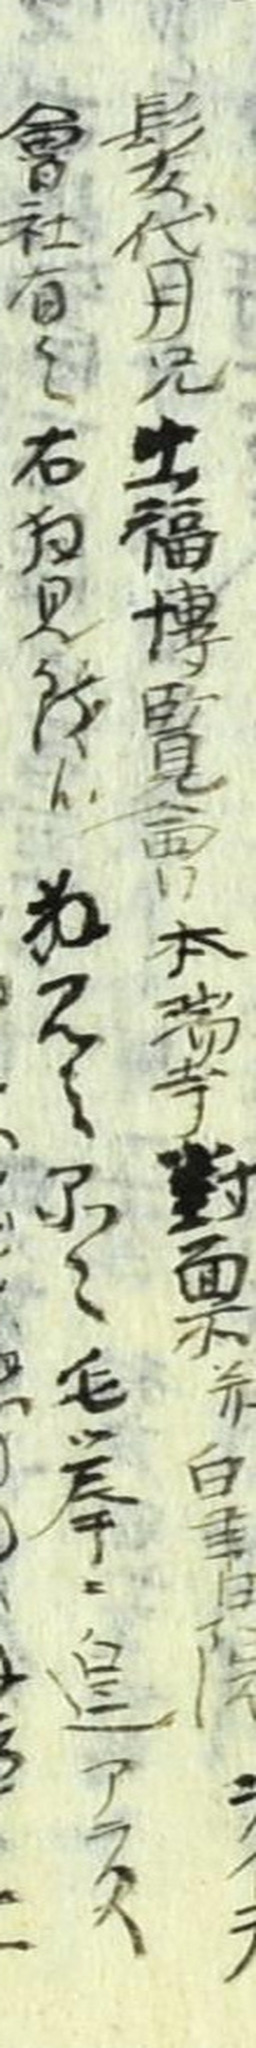中鰊会社有之右拝見致候拝見之品々毛挙ニ遑アラス
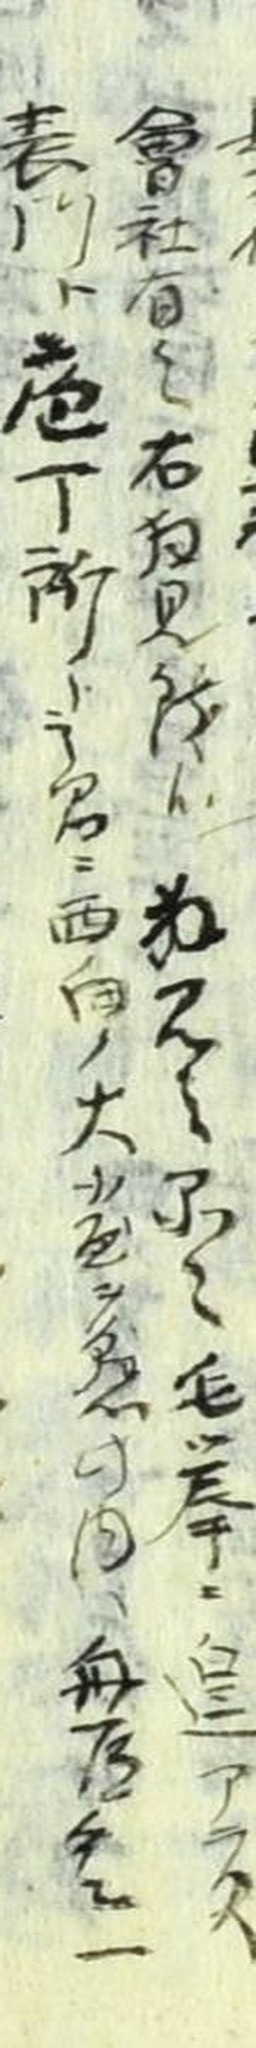夕餅表門ト庖丁所ト之間ニ西向ノ大小屋ヲ懸此内へ舟道具一
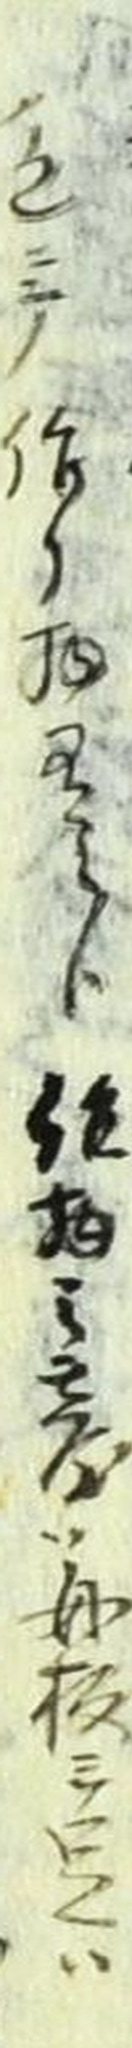色ニテ作り物有之候作物之台ハ舟板ニテ足ハ
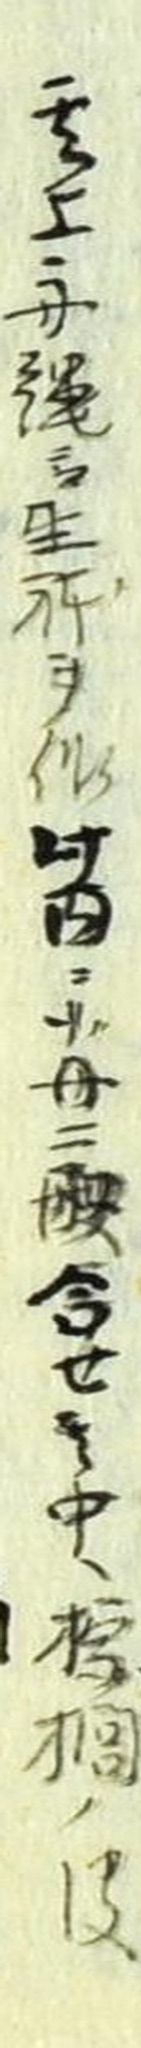其上舟縄ニ而生体ヲ作此内ニ小舟二艘合せ其中へ棕櫚ノ皮
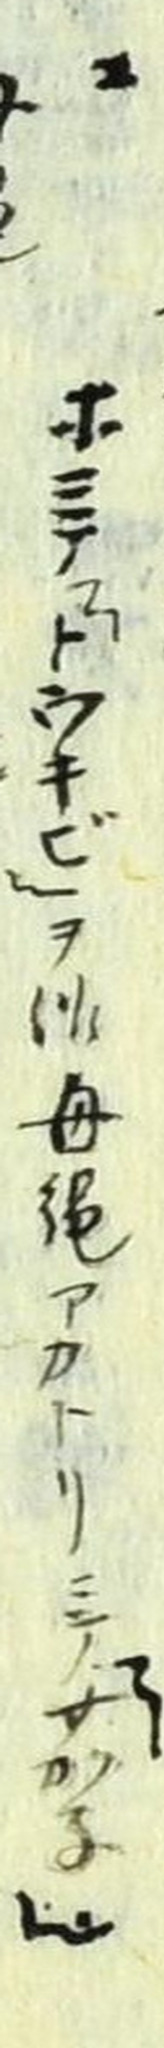ニ等ニテ「トウキビ」ヲ作舟縄アカトリニテ「茄子」
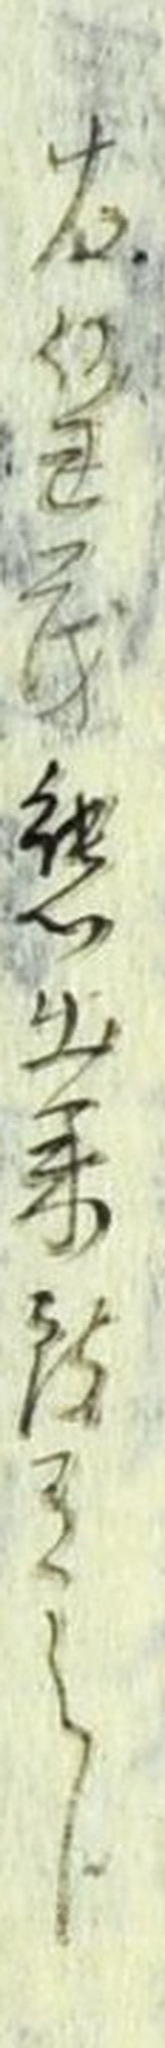右何れ茂態出来致有之候
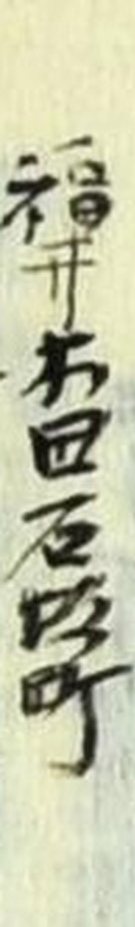福井木田石坂町
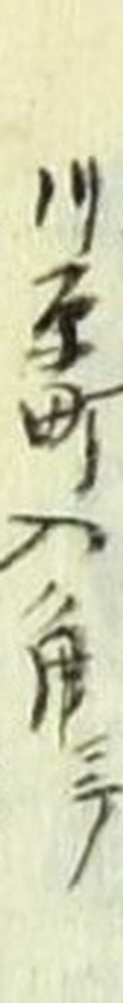川原町入角ニテ
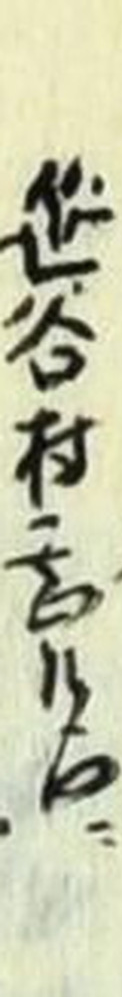笹谷村甚左衛門ニ
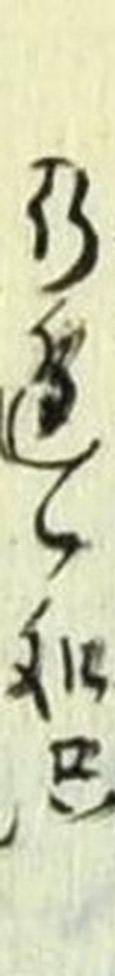行逢候処只
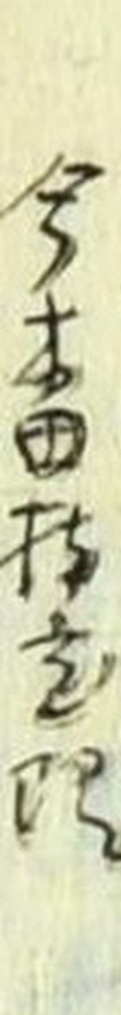今木田持宝院
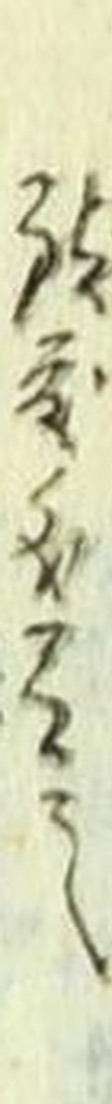致度義有之
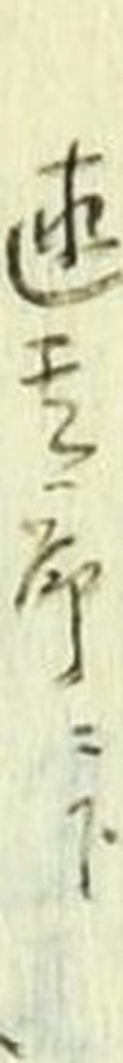述其節ニ下
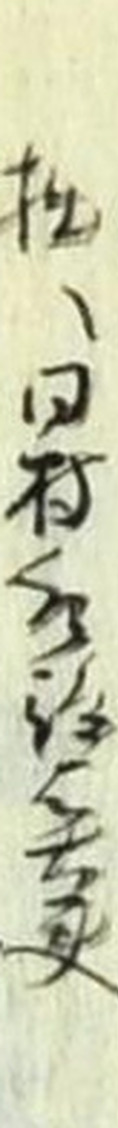拙へ同村水沢与太夫
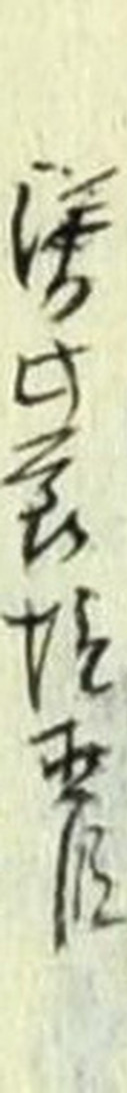湊此節塩直段
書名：（日記）
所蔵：福井県文書館 Fukui Prefectural Archives
